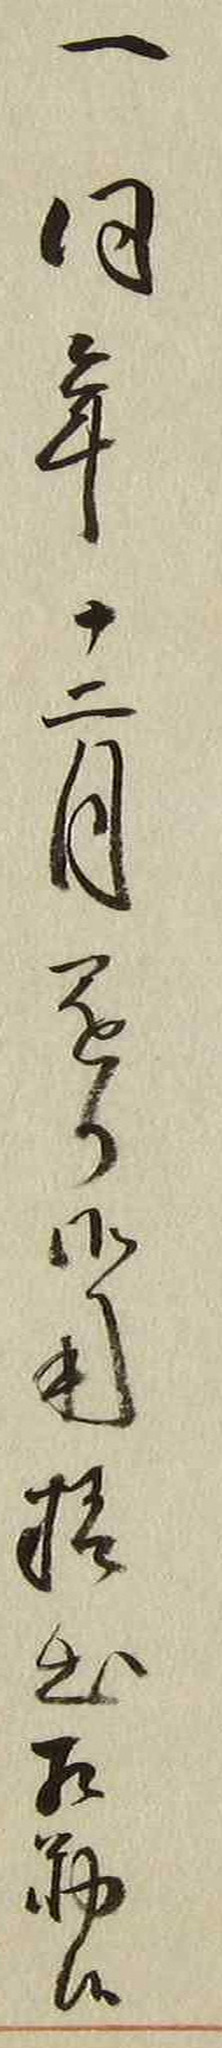一同年十二月懸り御用精出相勤候
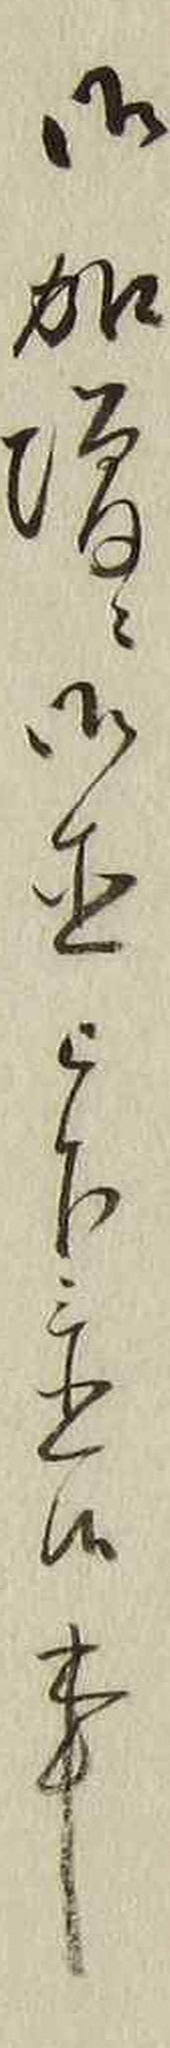御加増ニ御直被下置候事
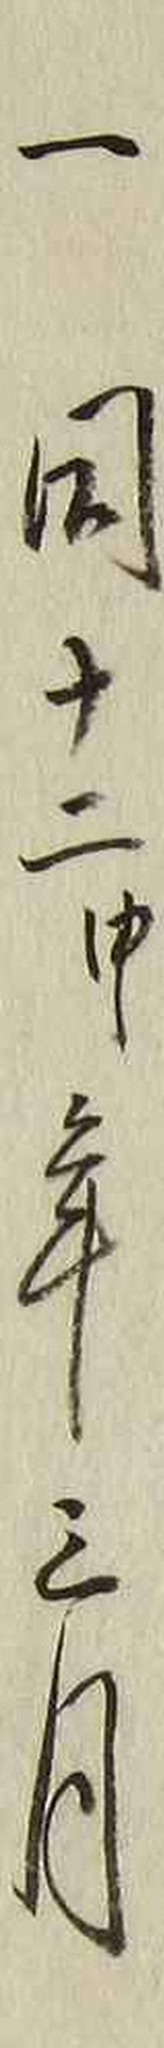一同十二申年三月
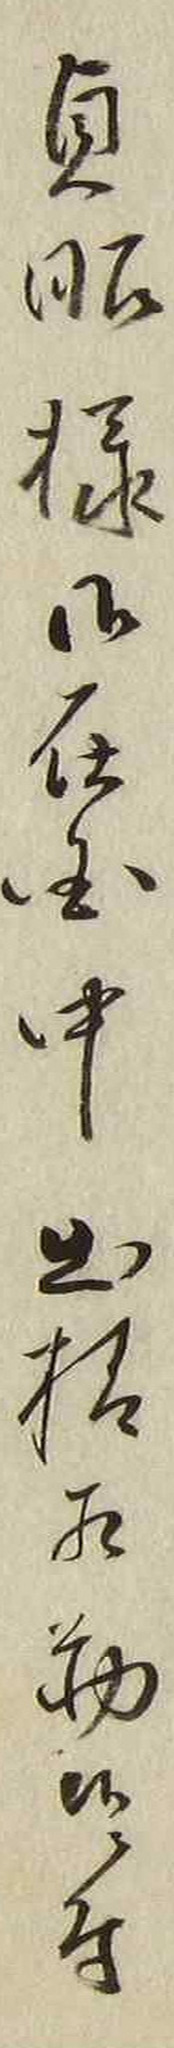貞昭様御在国中出精相勤候ニ付
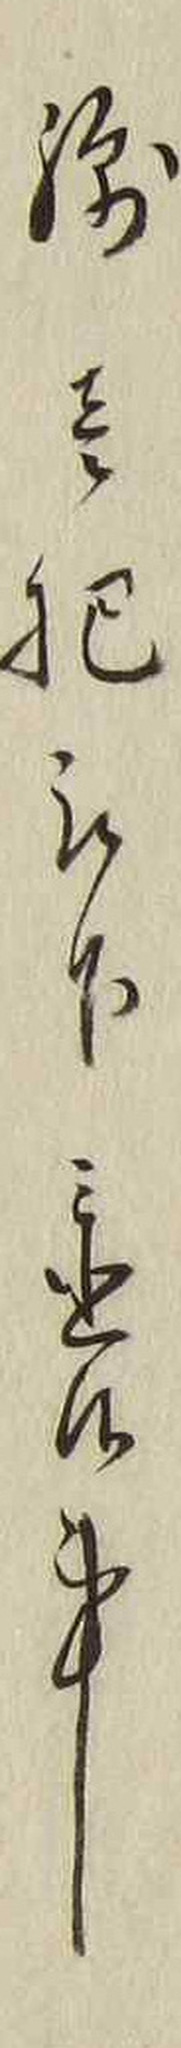綿壱把被下置候事

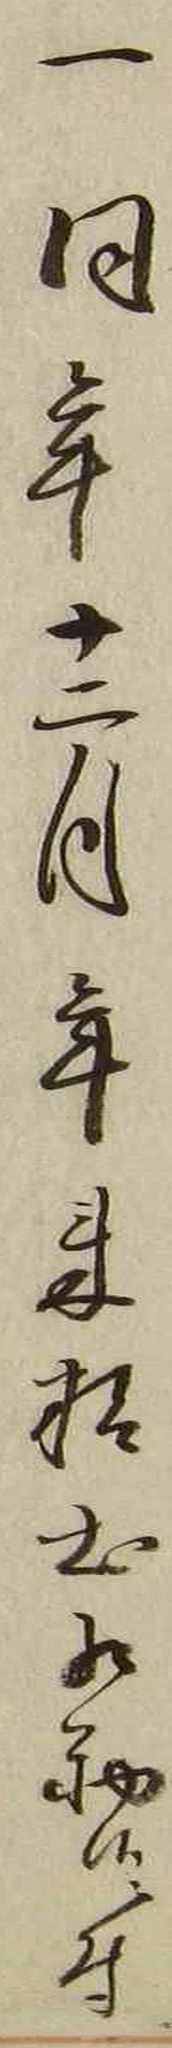一同年十二月年来精出相勤候ニ付
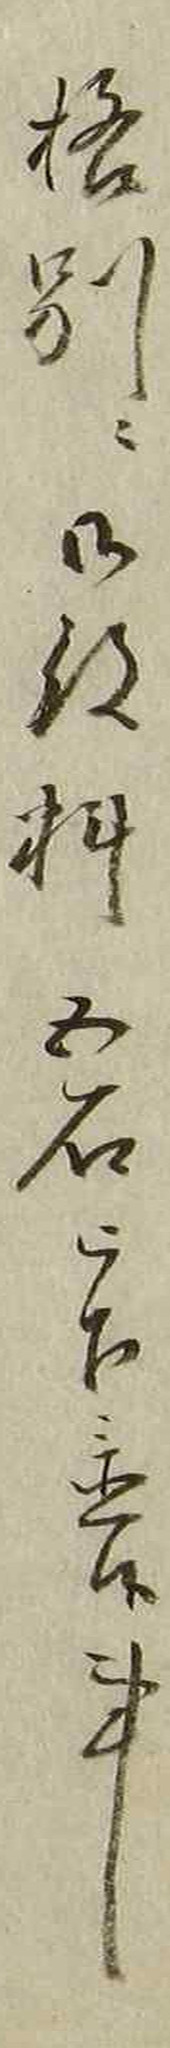格別ニ御役料五石被下置候事
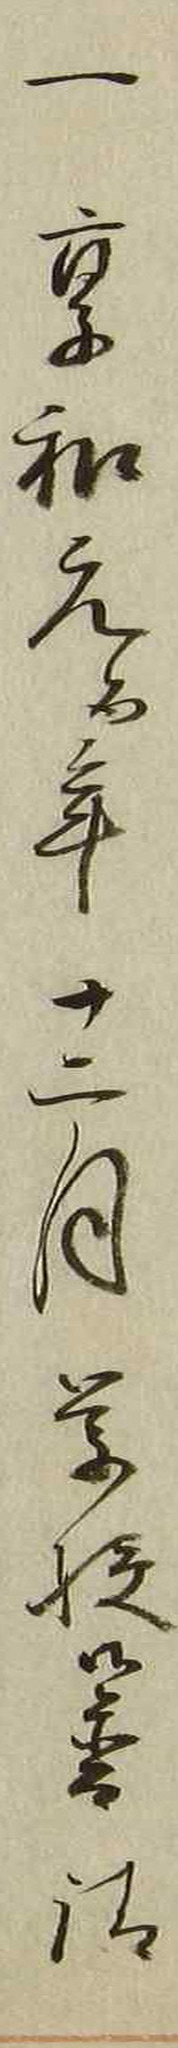一享和元酉年十二月学校御普請
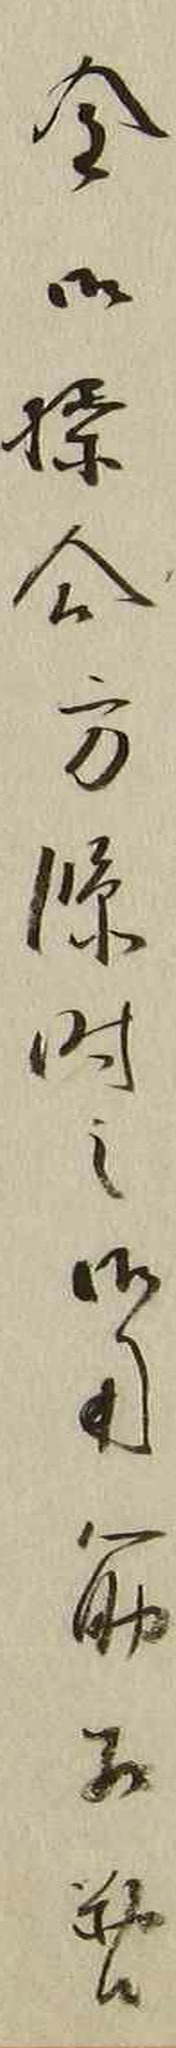金御擦合方臨時之御用筋相勤候
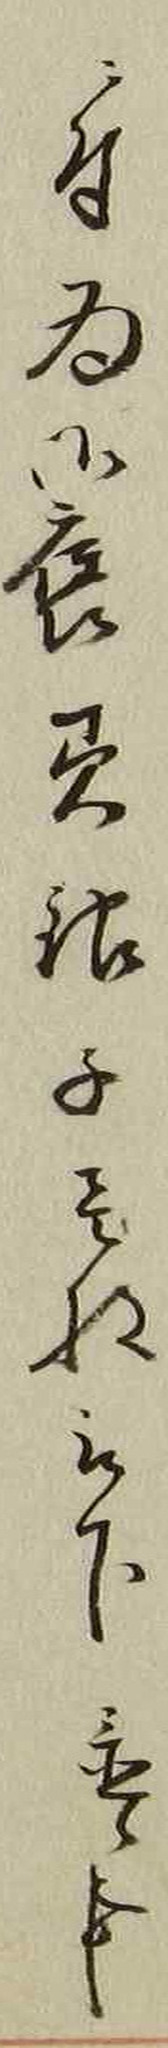ニ付為御褒美銀子壱枚被下置候事
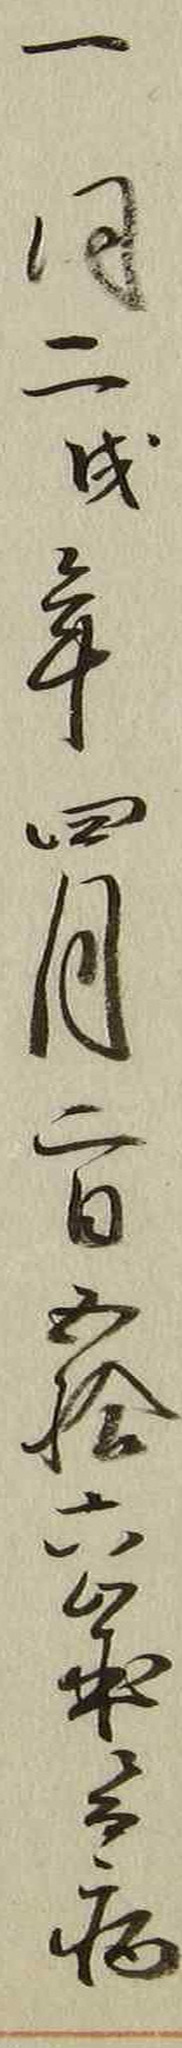一同二戌年四月二日五拾六歳ニ而病
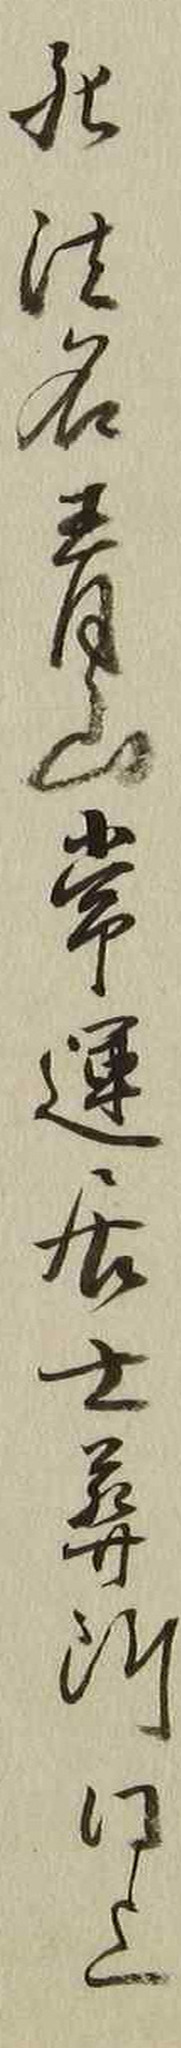死法名青山常運居士葬所同上
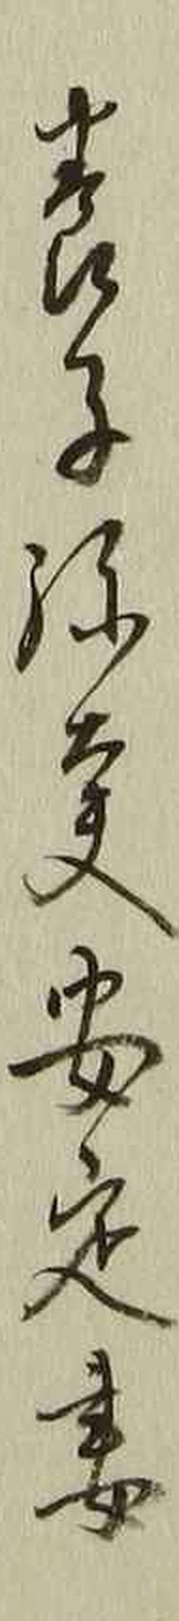女養子弥大夫安定妻
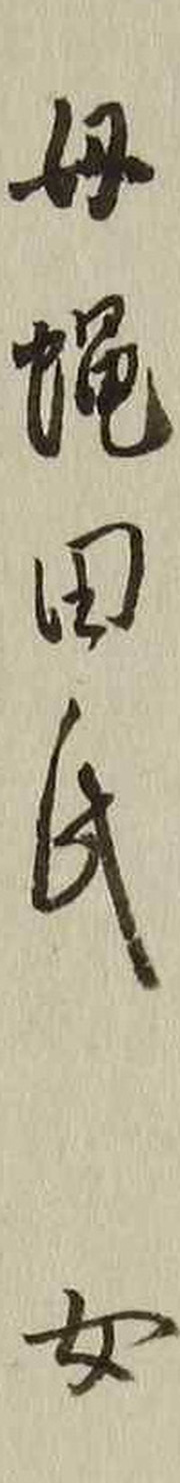母蝿田氏女
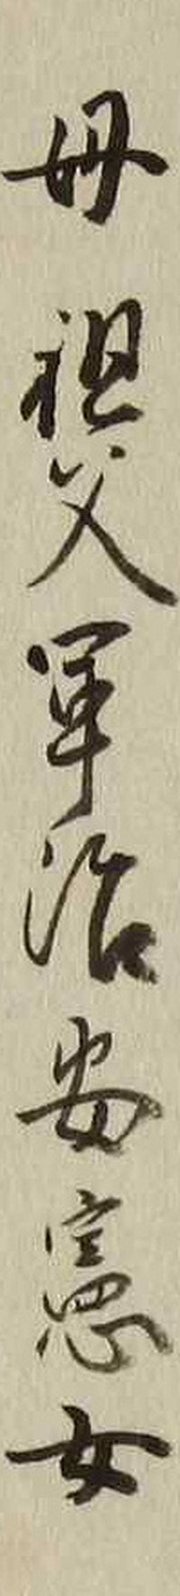母祖父軍治安憲女
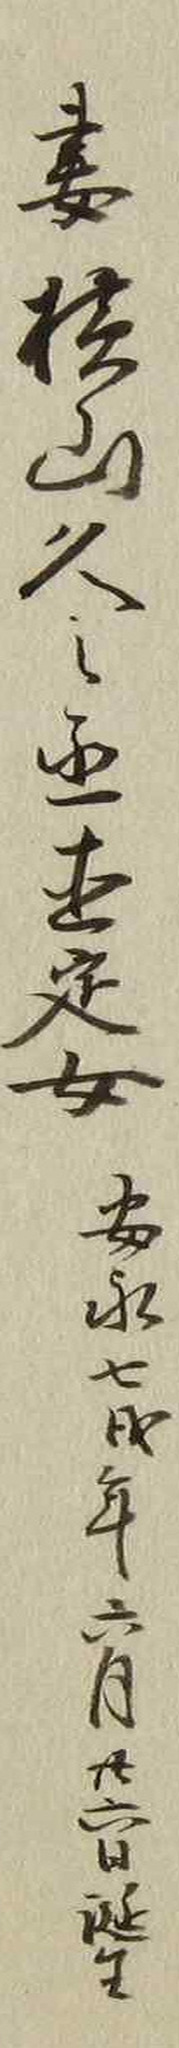妻横山久之亟直定女安永七戌年六月廿六日誕生
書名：諸士系譜　巻之32　い之部32
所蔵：会津若松市立会津図書館
